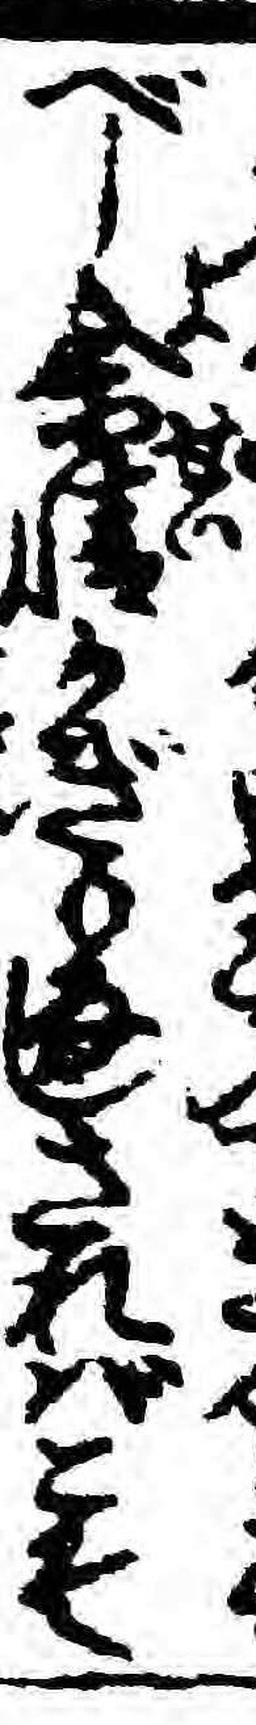べし余情かぎりなしさればこそ
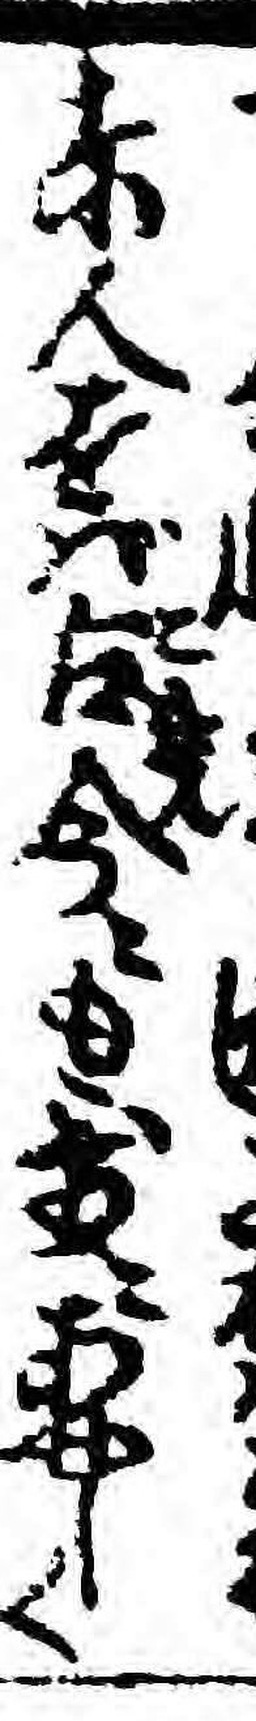赤人をば古今にも哥にあやしく
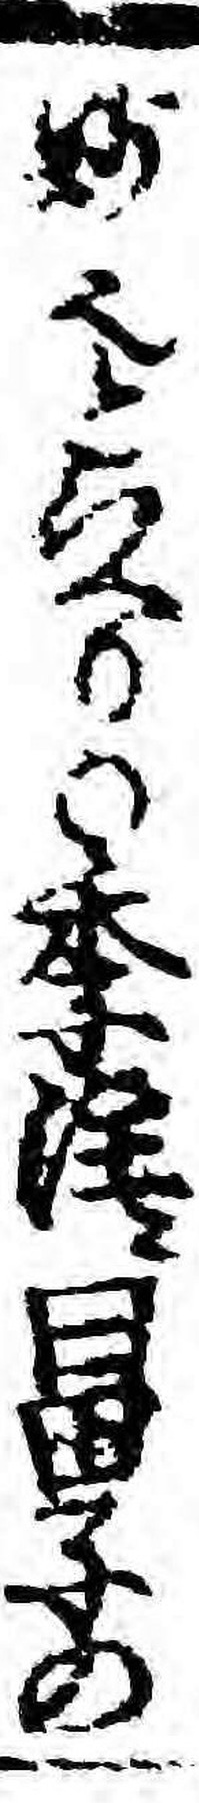妙也といへり〇季注に曰田子の
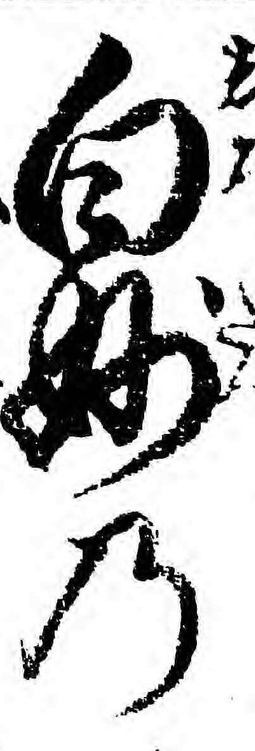白妙の
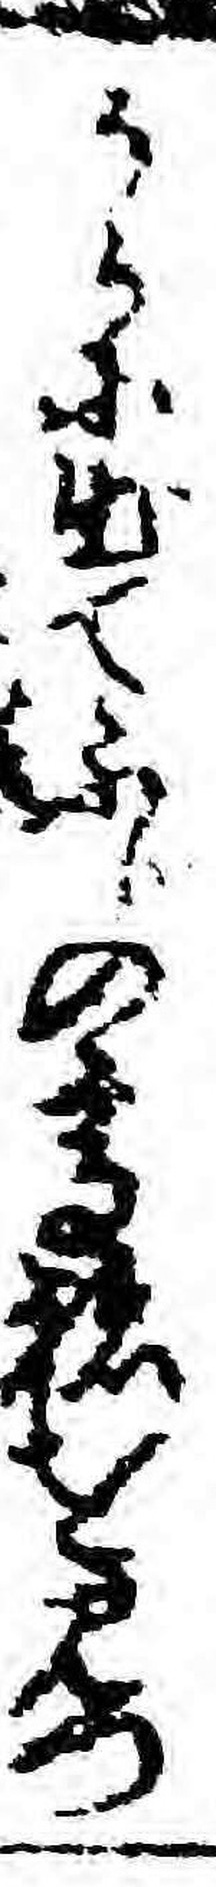うらに出てふじの高ねを見つ
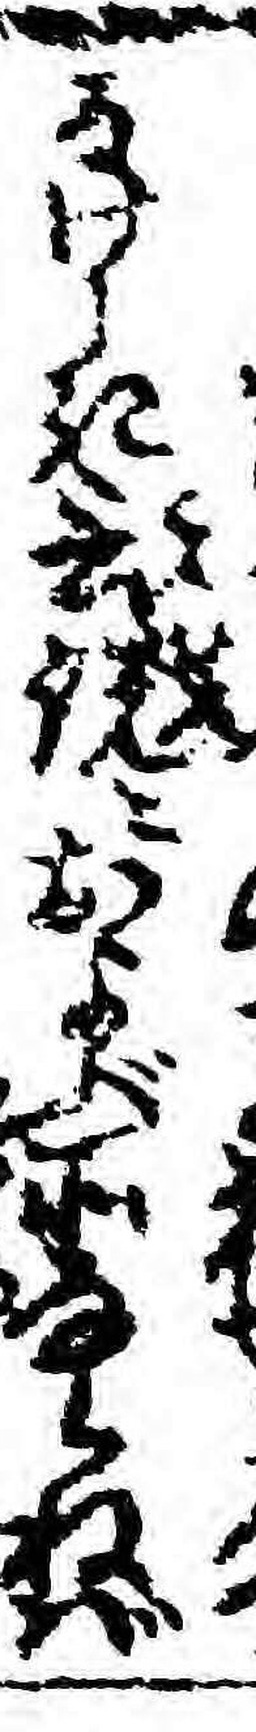るけしき言説におよぶ所ならねば
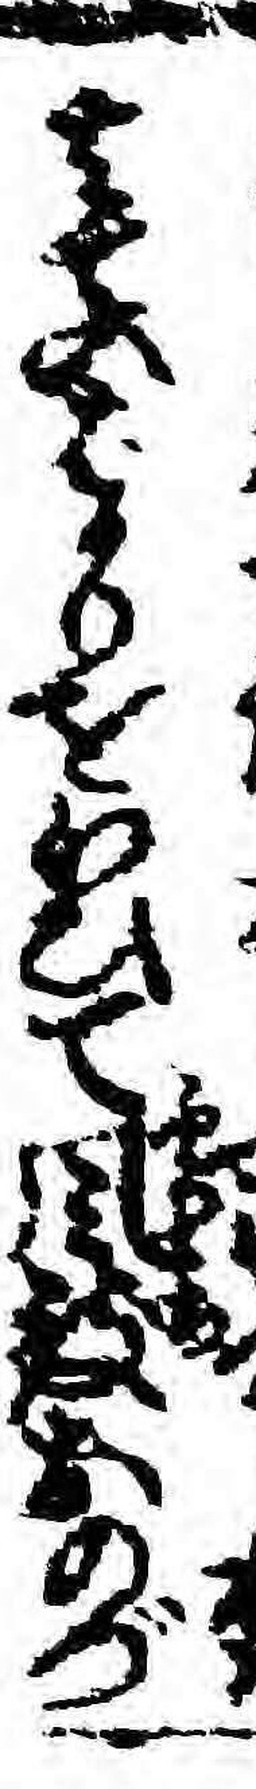其ていばかりをいひて風致おのづ
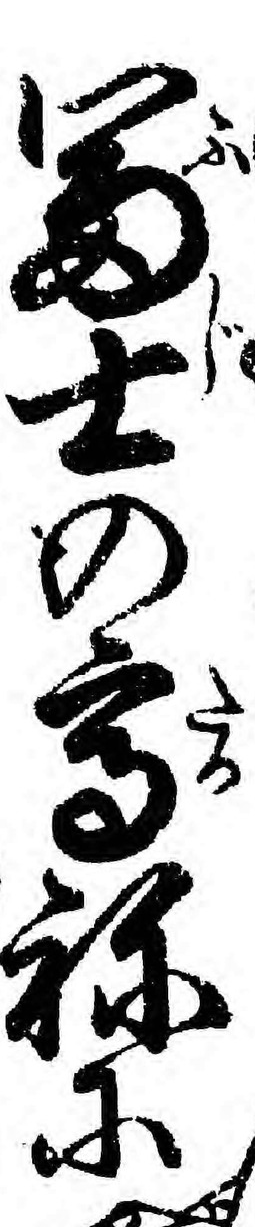冨士の高ねに
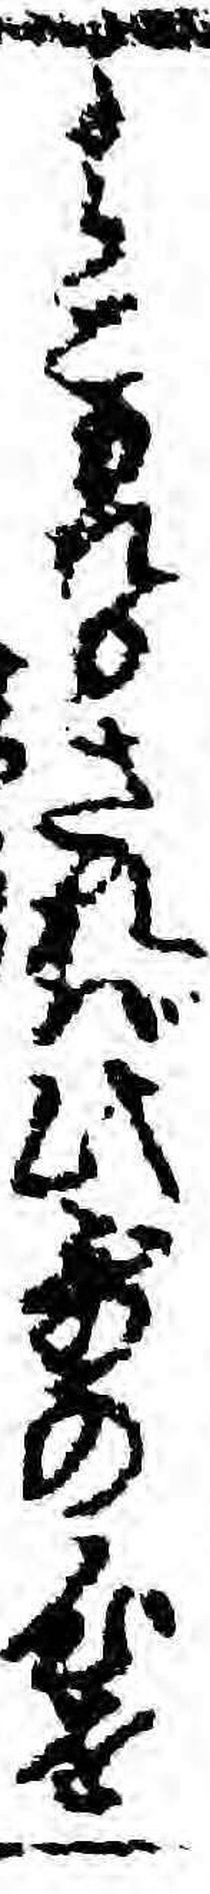からこもれりされば此哥の心を
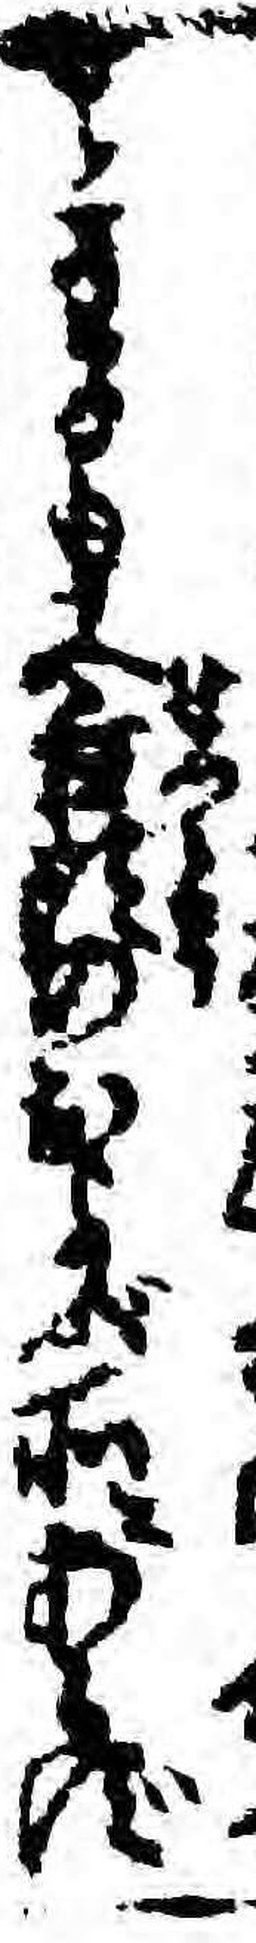ことわるも又舌頭のおよぶ所あらず
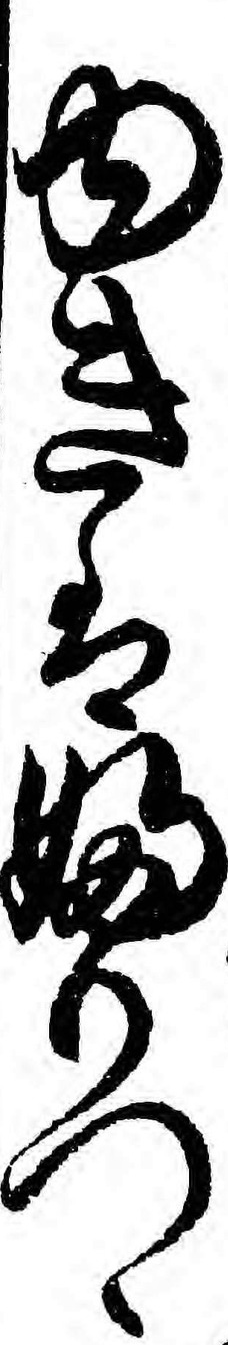ゆきはふりつゝ
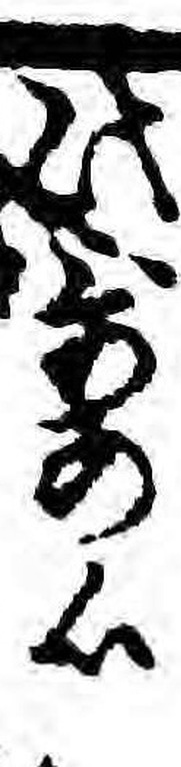此哥の心
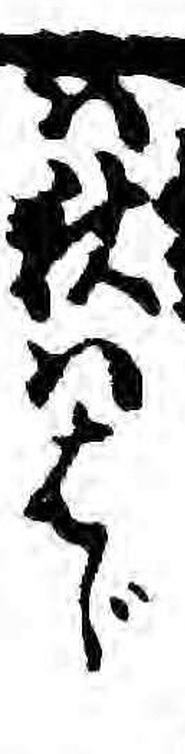は秋ははじ
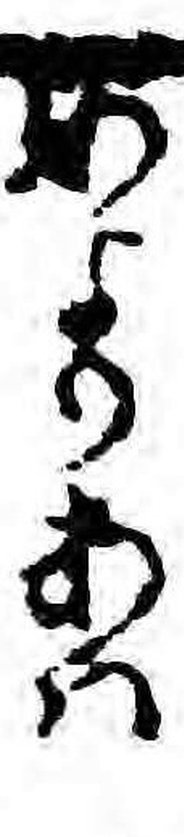めよりあは
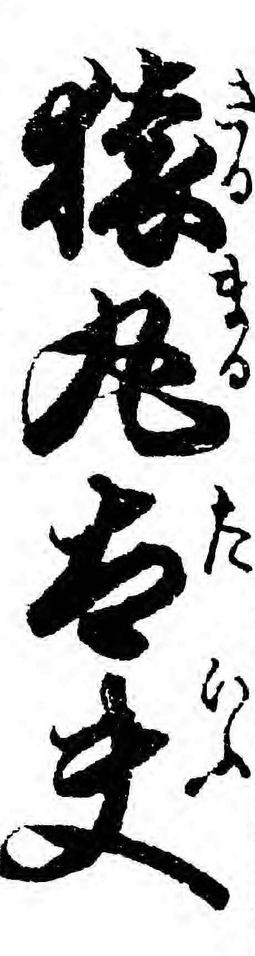猿丸太夫
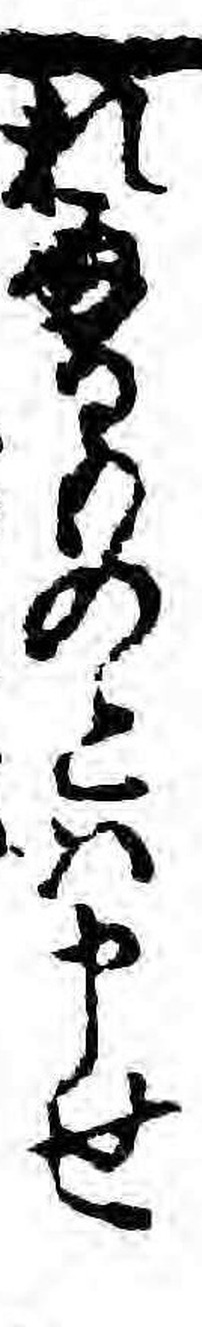れなるものとは申せ
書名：頭書和歌注譯／壽賀多百人一首小倉錦
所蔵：国文学研究資料館
